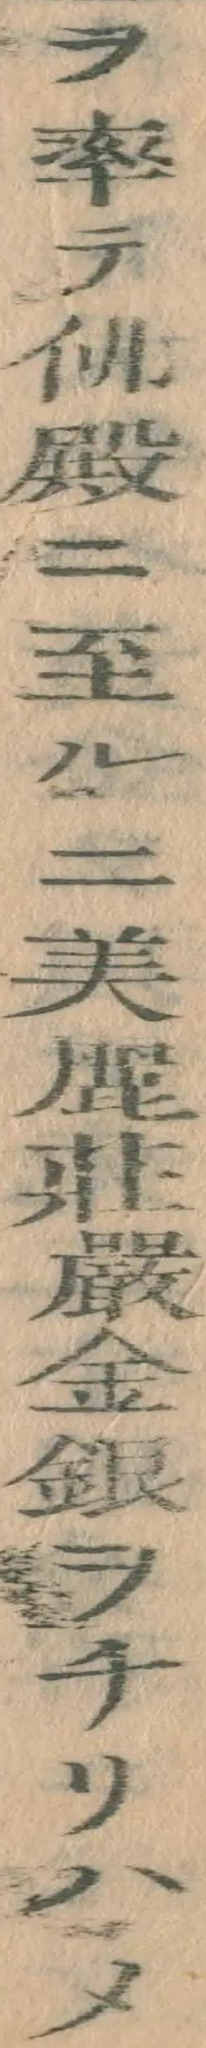ヲ率テ仏殿ニ至ルニ美麗荘厳金銀ヲチリハメ
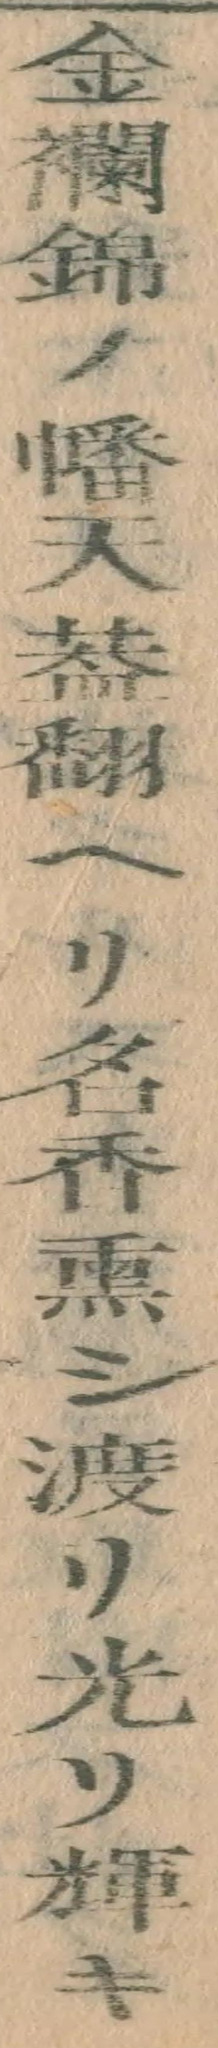金襴錦ノ幡天蓋翻ヘリ名香燻シ渡リ光リ輝キ
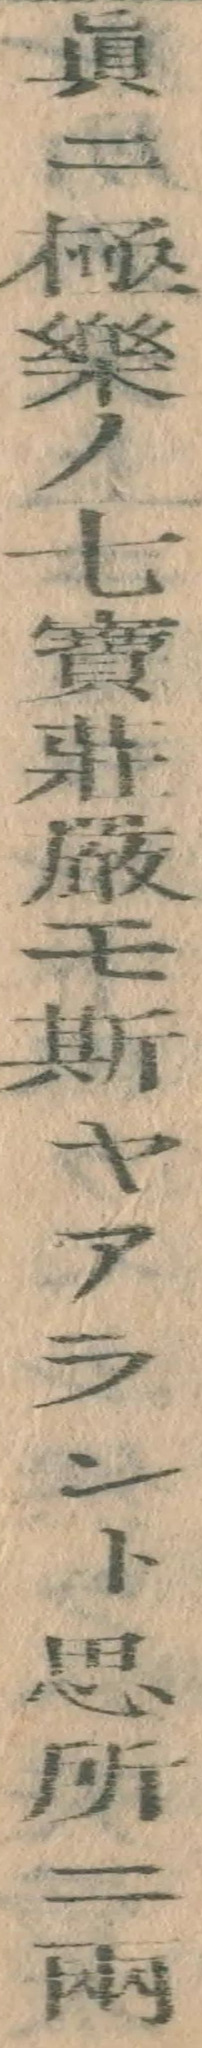真ニ極楽ノ七宝荘厳モ斯ヤアラント思所ニ両
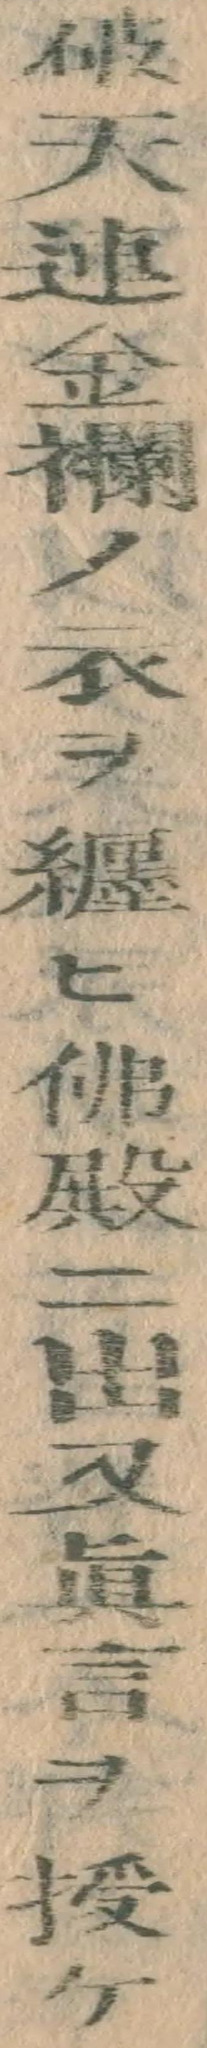破天連金襴ノ衣ヲ纒ヒ仏殿ニ出又真言ヲ授ケ
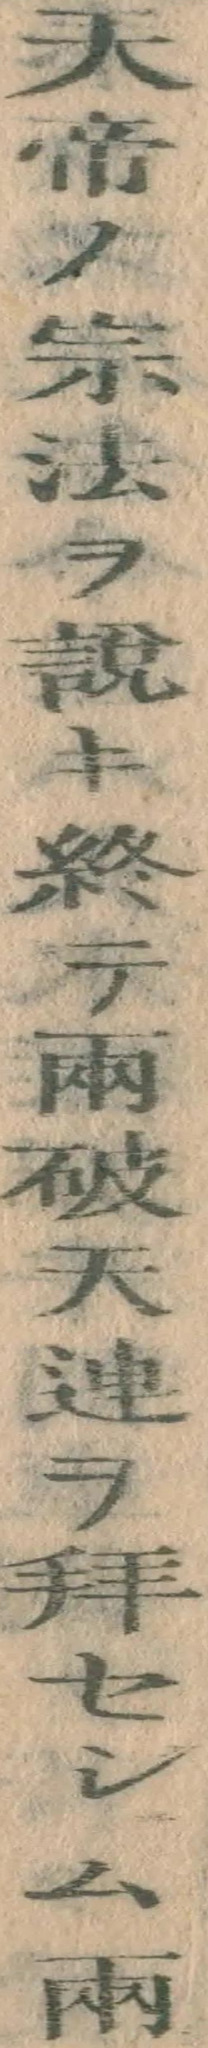天帝ノ宗法ヲ説キ終テ両破天連ヲ拝セシム両
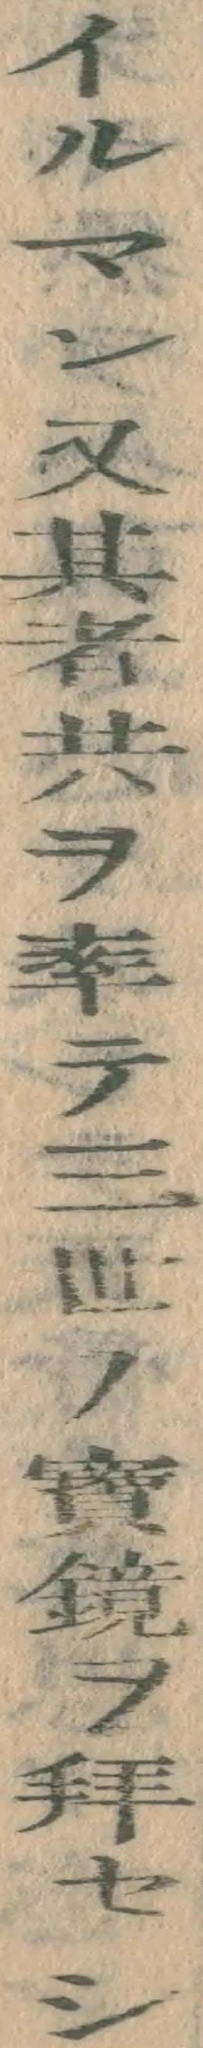イルマン又其者共ヲ率テ三世ノ宝鏡ヲ拝セシ
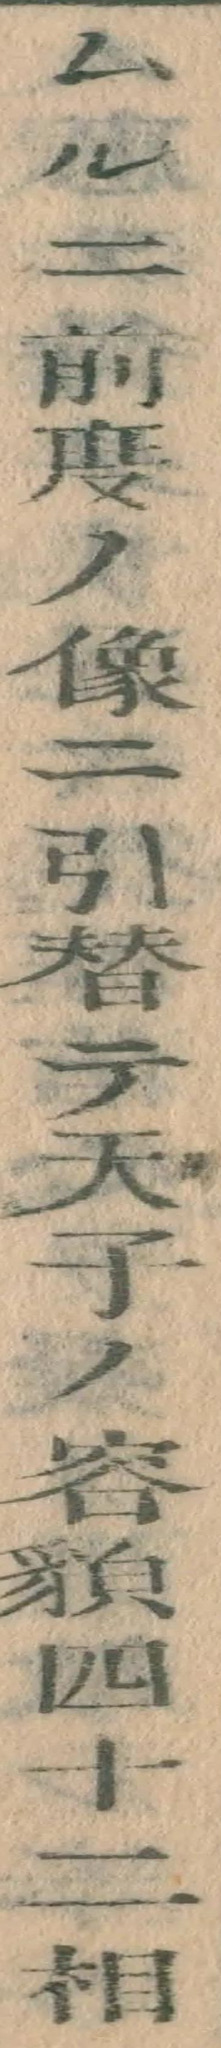ムルニ前度ノ像ニ引替テ天子ノ容貌四十二相
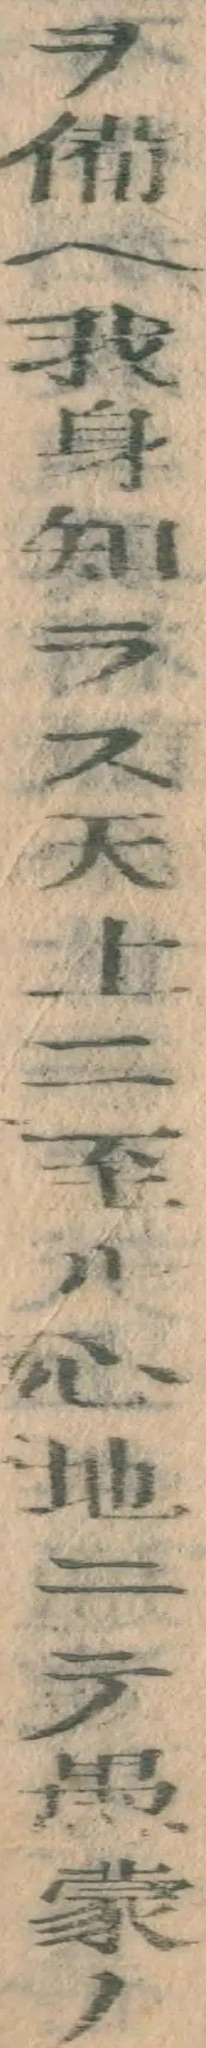ヲ備ヘ我身知ラス天上ニ至ル心地ニテ愚蒙ノ
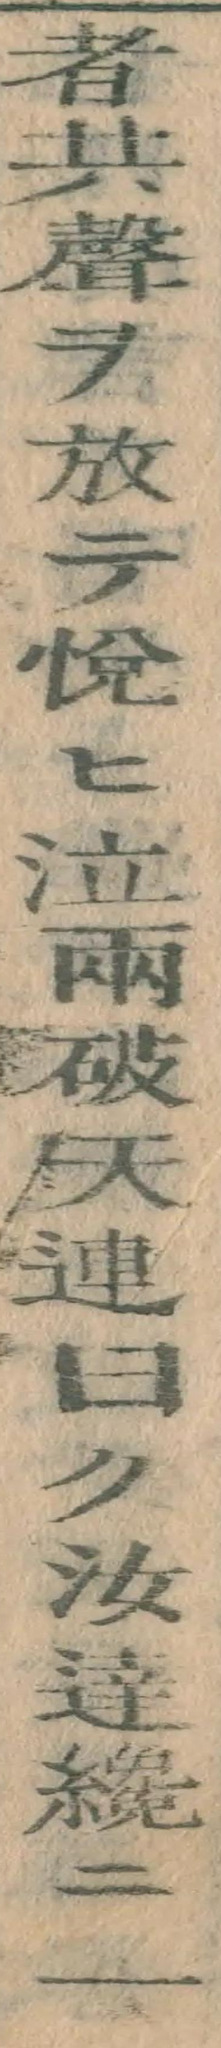者共声ヲ放テ悦ヒ泣両破天連曰ク汝達纔ニ一

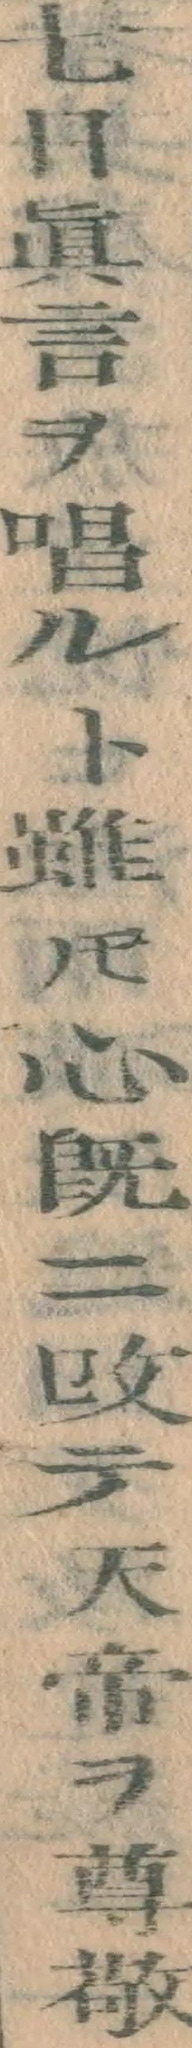七日真言ヲ唱ルト雖トモ心既ニ改テ天帝ヲ尊敬
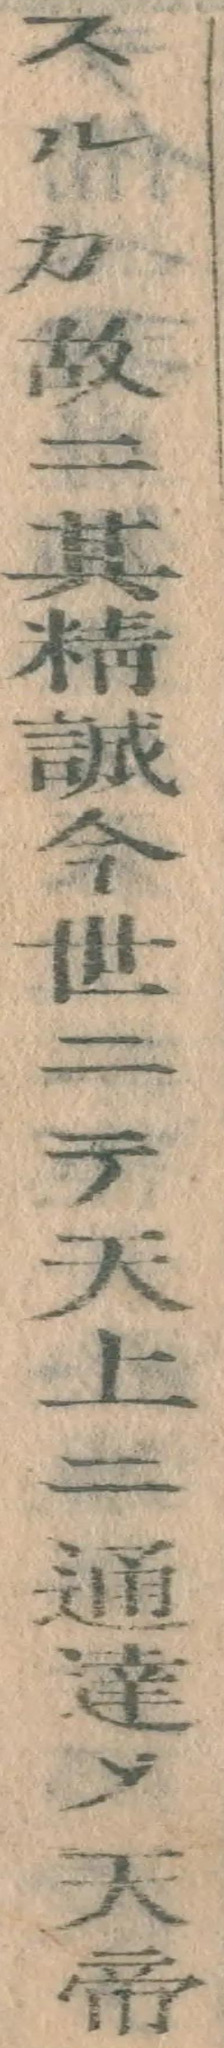スルカ故ニ其精誠今世ニテ天上ニ通達シテ天帝
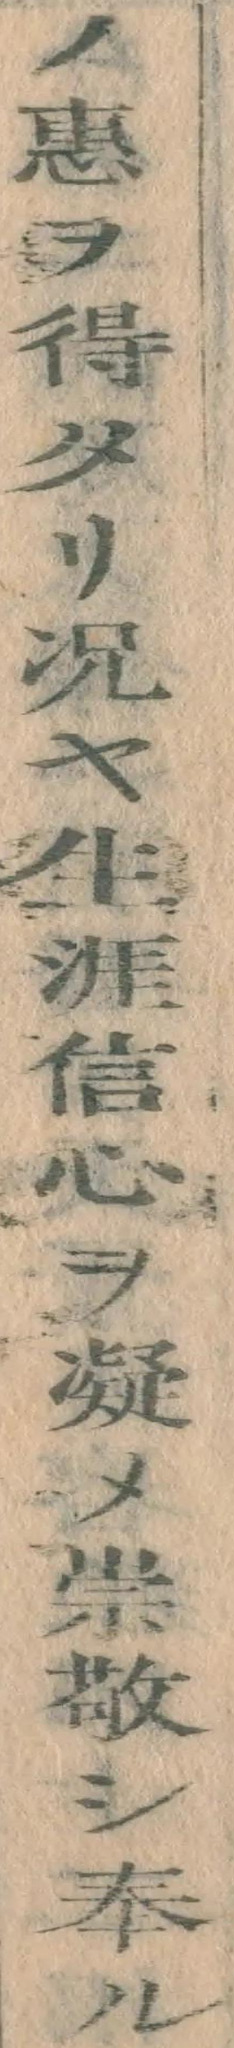ノ恵ヲ得タリ況ヤ生涯信心ヲ凝メ崇敬シ奉ル
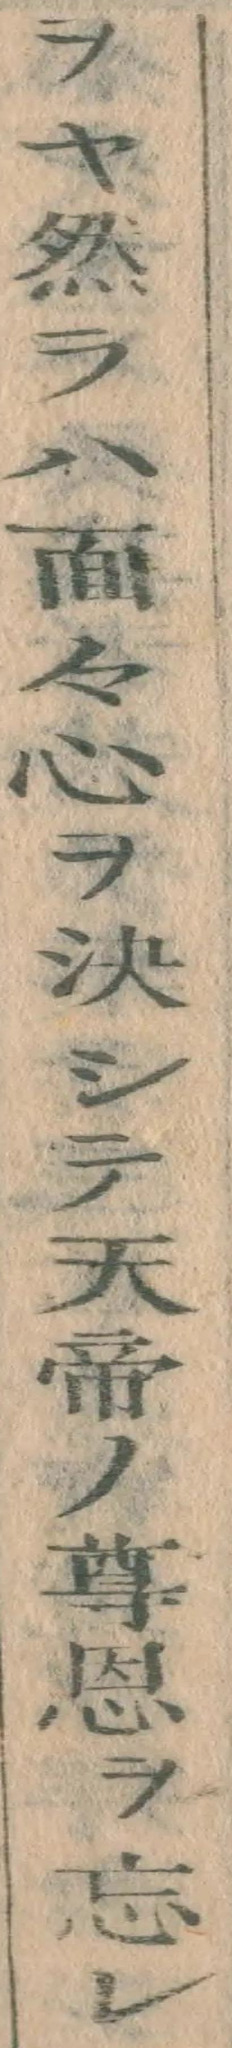ヲヤ然ラハ面々心ヲ決シテ天帝ノ尊恩ヲ忘レ
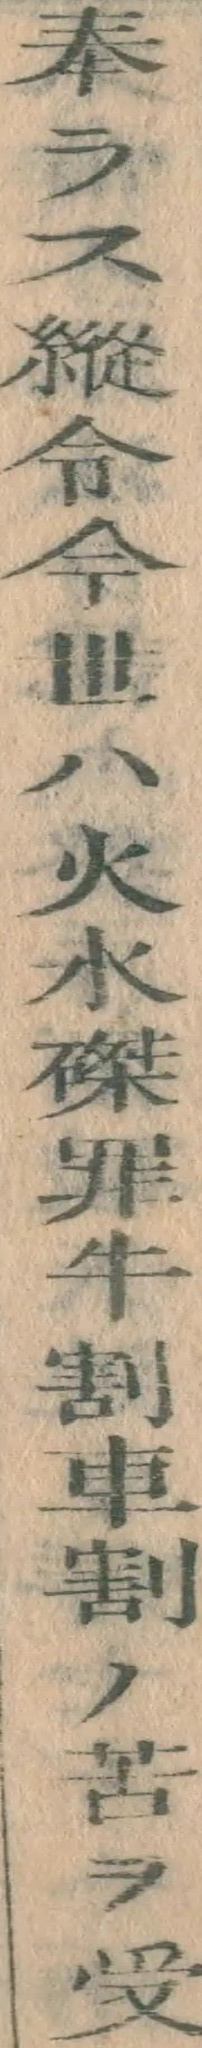奉ラス縦令今世ハ火水磔罪牛割車割ノ苦ヲ受
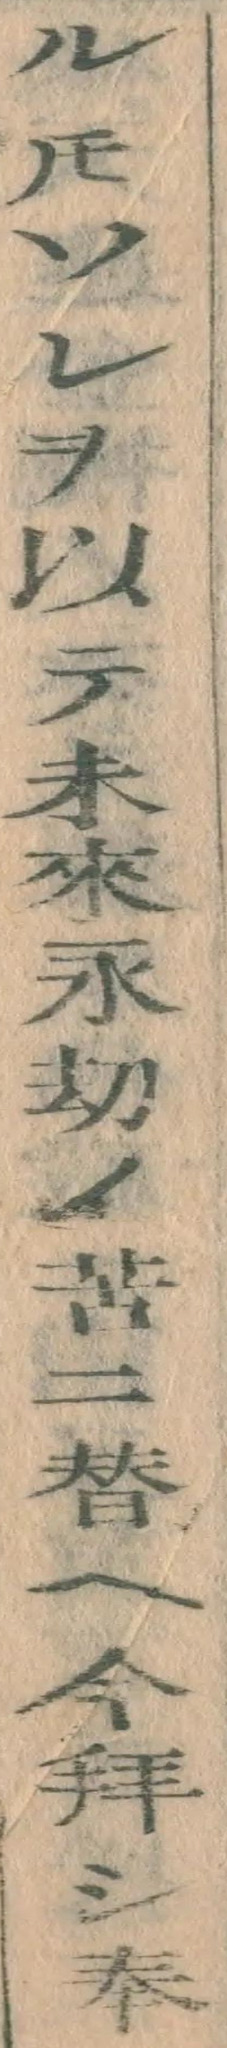ルトモソレヲ以テ未来永劫ノ苦ニ替ヘ今拝シ奉
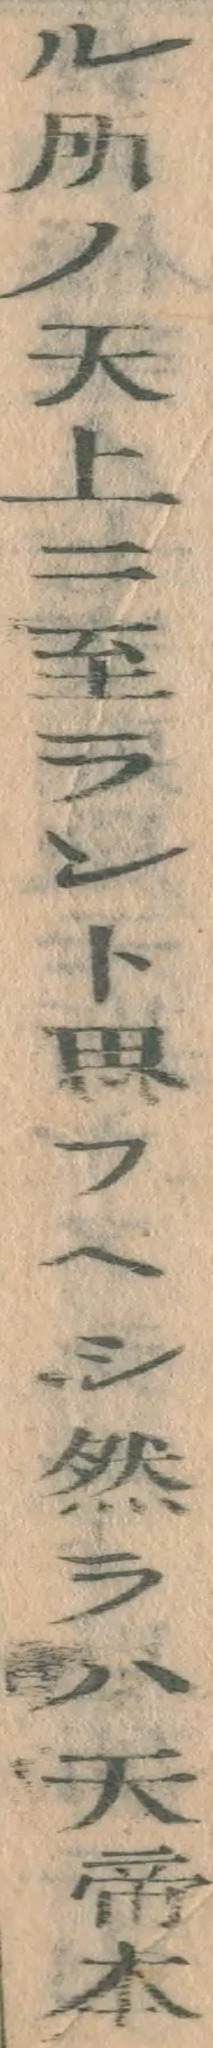ル所ノ天上ニ至ラント思フヘシ然ラハ天帝本
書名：南蛮寺興廃記
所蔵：国立国会図書館 National Diet Library, JAPAN
